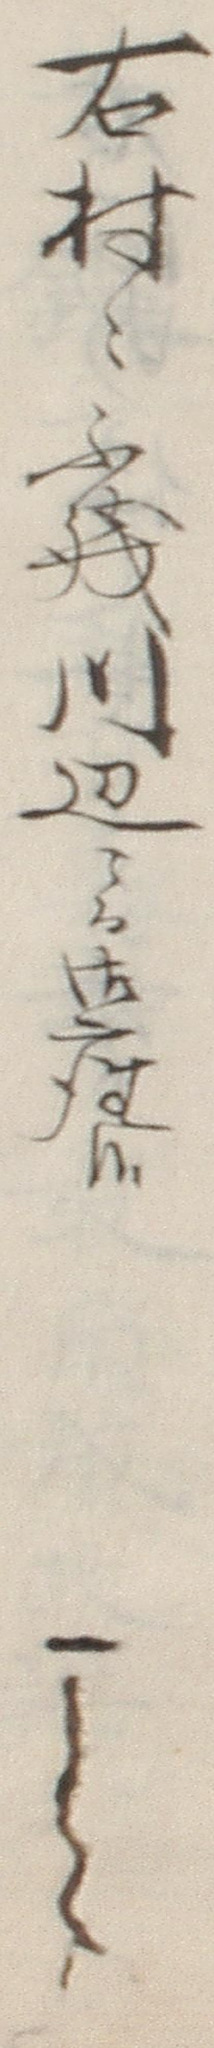右村々不残川辺ニ而御座候
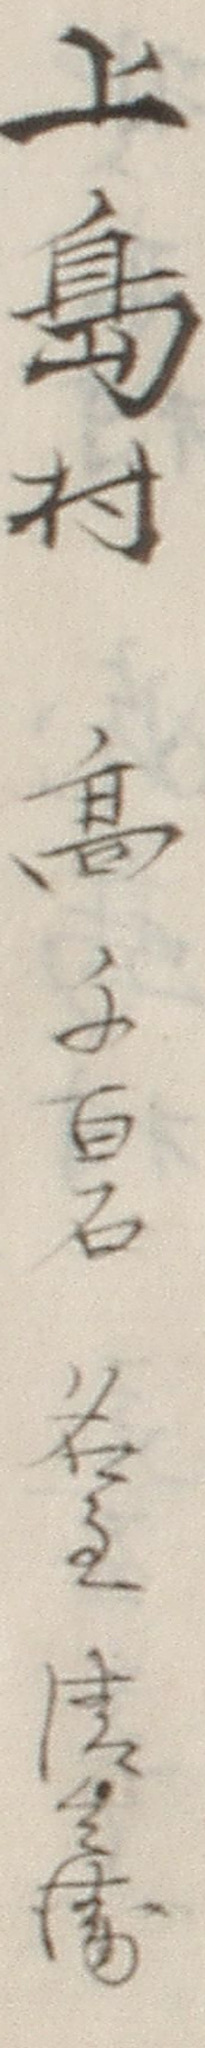上島村高千百石名主清兵衛
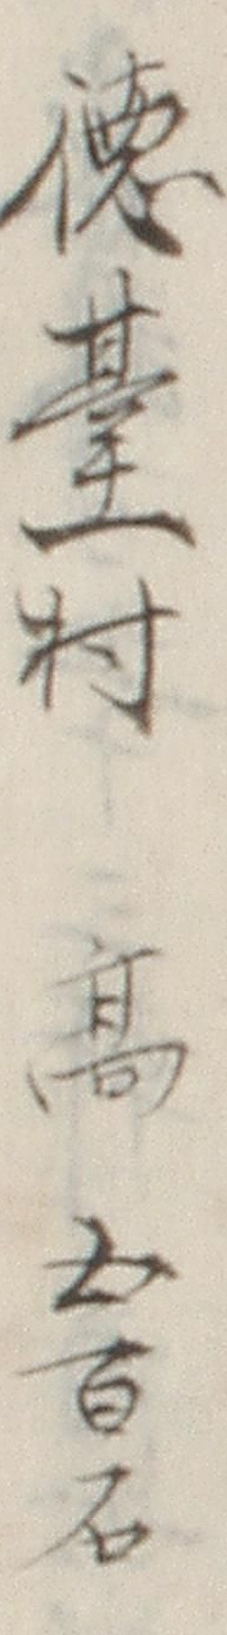徳台村高五百石
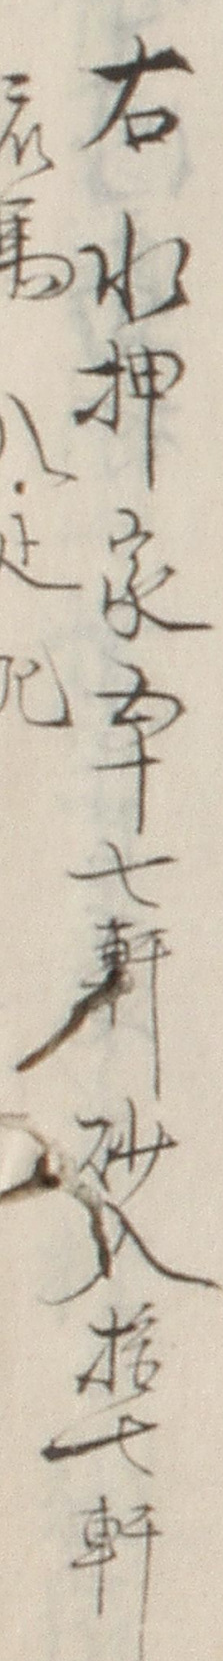右水押家五十七軒砂入拾七軒
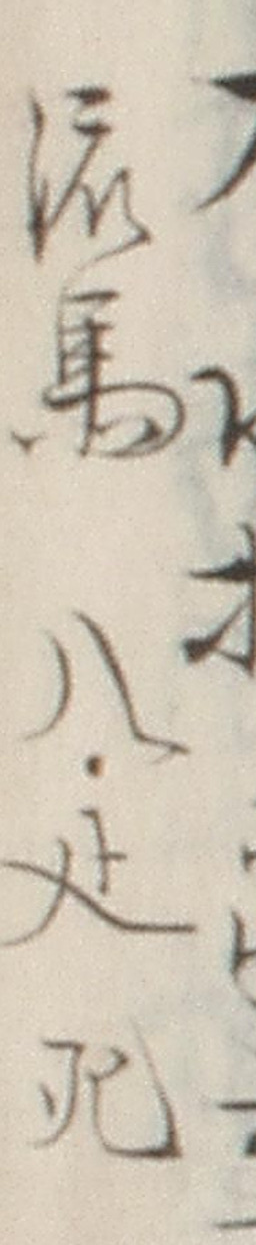流馬八疋死

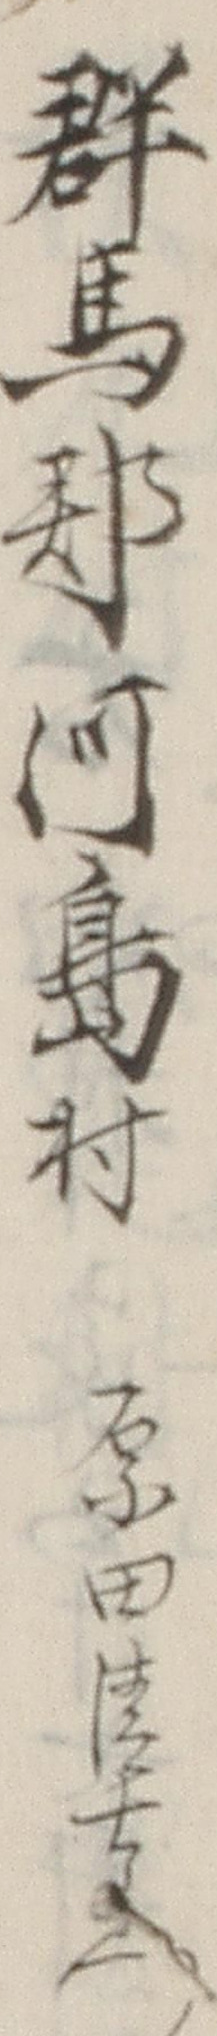群馬郡河島村原田清右衛門
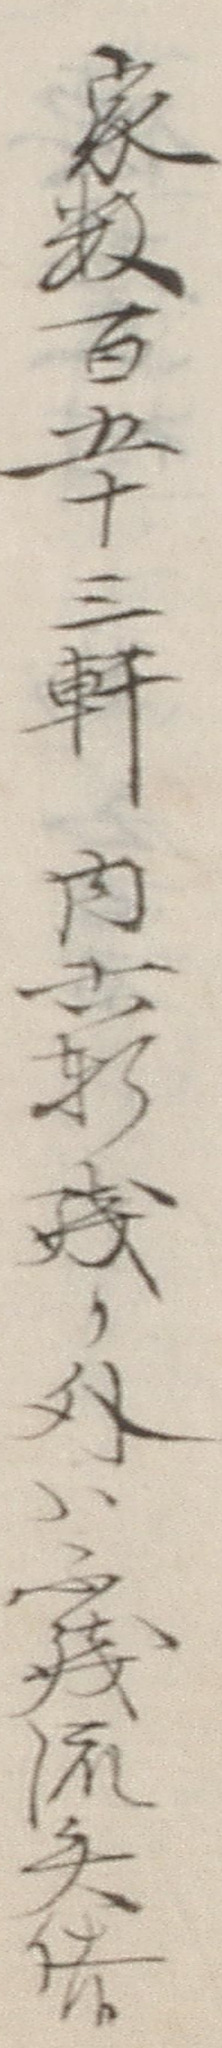家数百五十三軒内六軒残り外ハ不残流失仕候
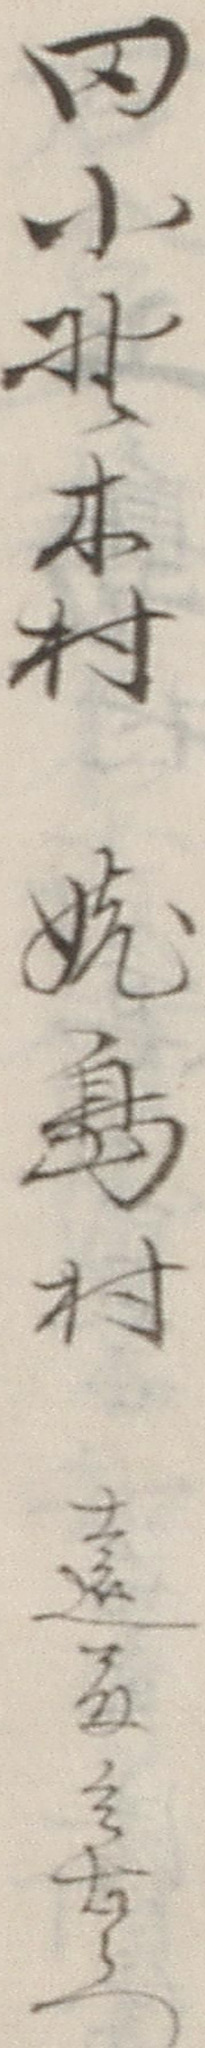田小野木村姥島村遠藤今右衛門
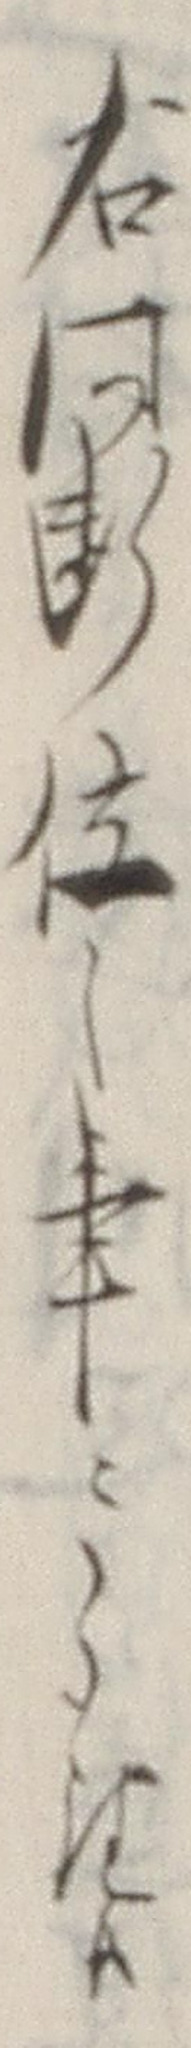右同断位之事ニ御座候
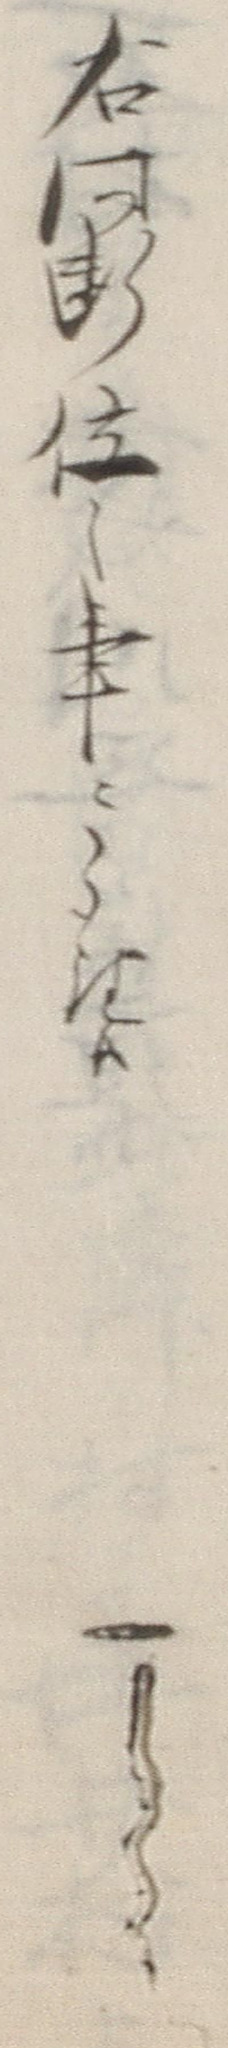右同断位之事ニ御座候
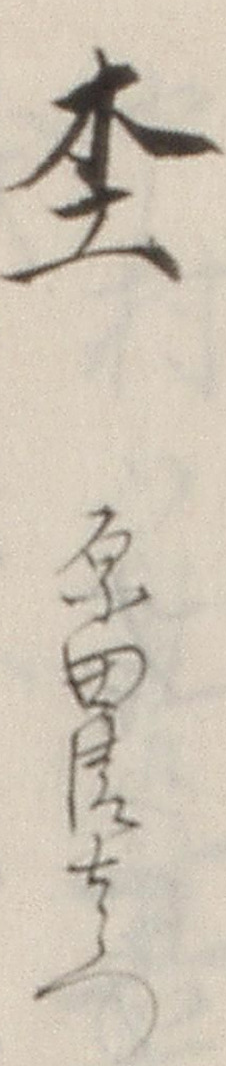杢原田清右衛門
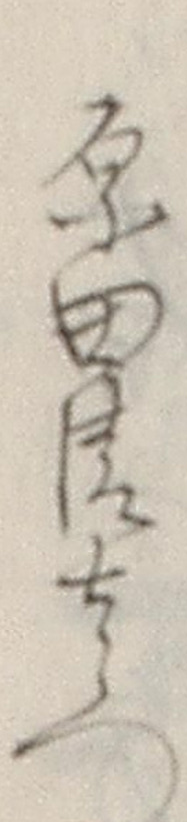杢原田清右衛門
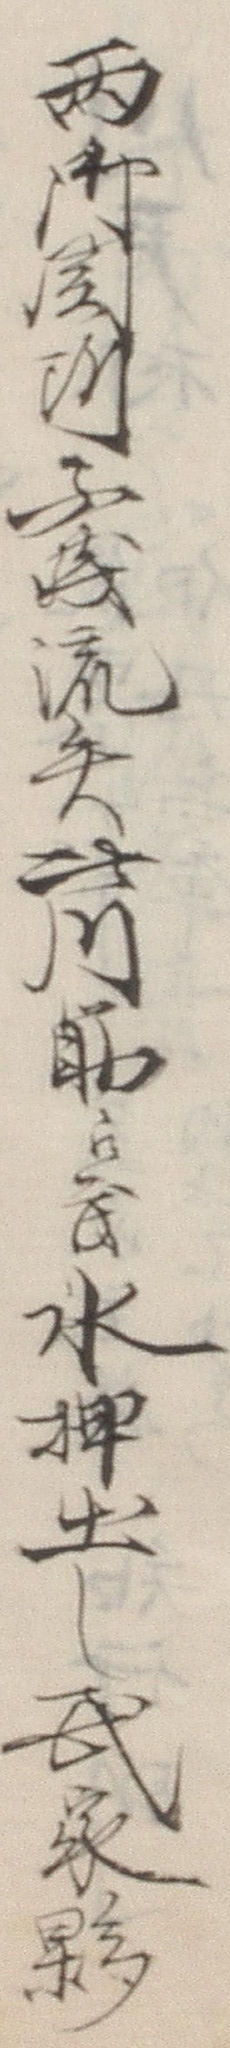両御関所不残流失此川筋えも水押出し民家夥
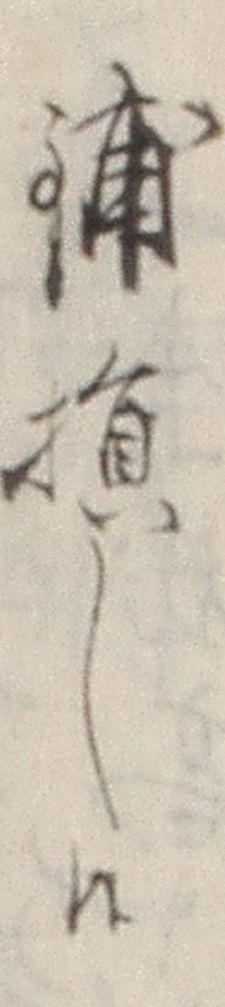鋪損し候
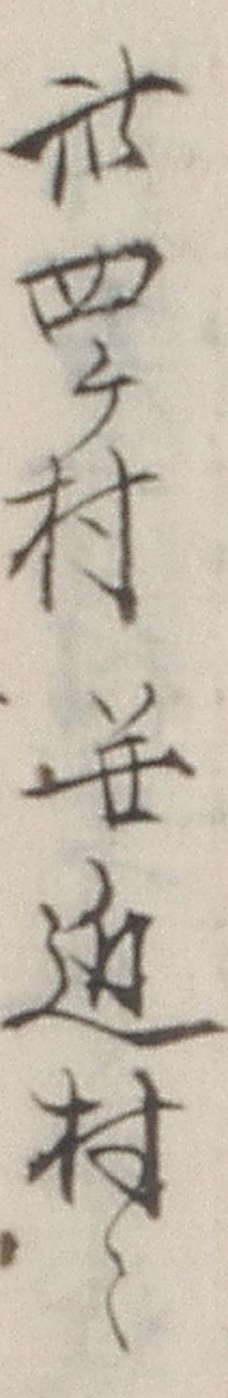此四ケ村幷近村々
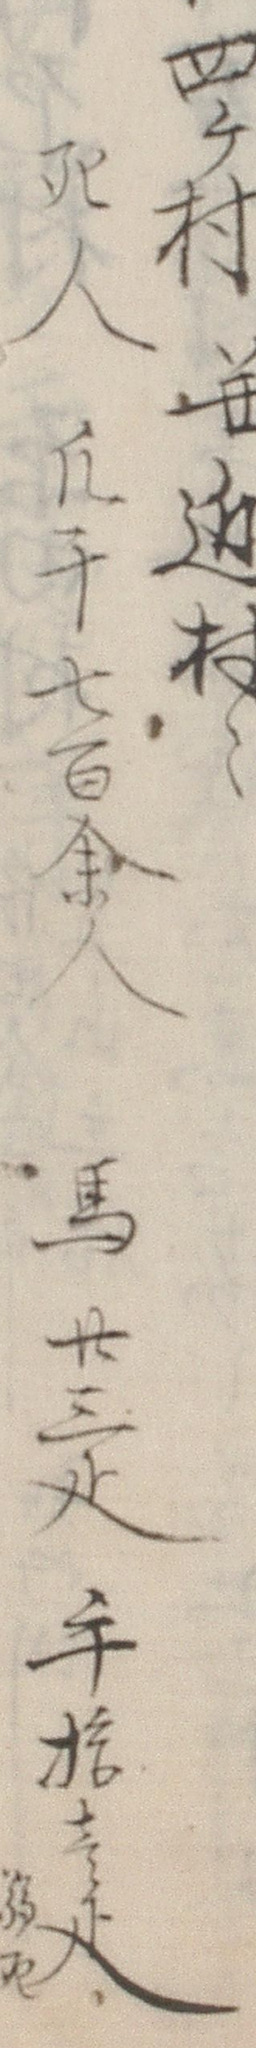死人凡千七百余人馬廿三疋牛拾壱疋
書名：[諸国災害記録]
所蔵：東京大学地震研究所図書室 Earthquake Research Institute Library, The University of Tokyo, JAPAN
